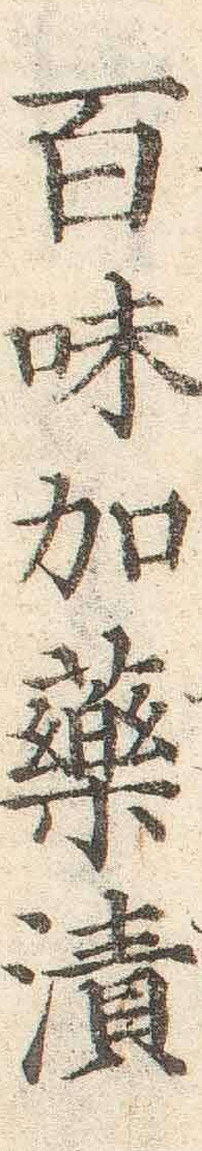百味加薬漬
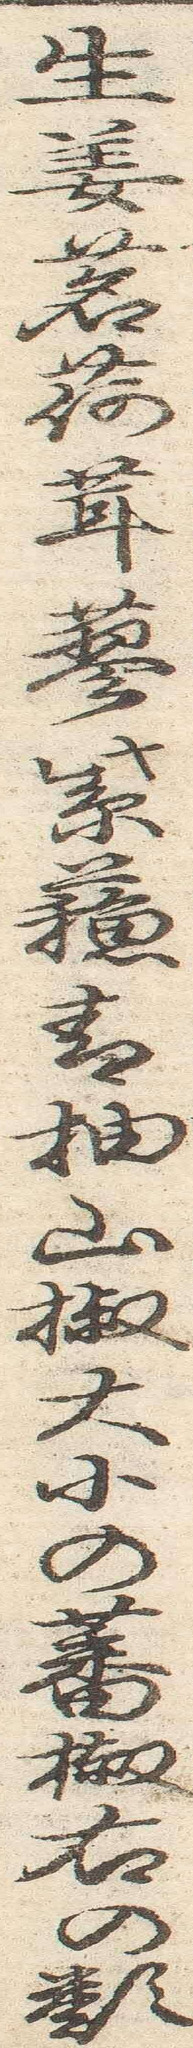生姜茗荷茸蓼紫蘇青柚山椒大小の蕃椒右の類

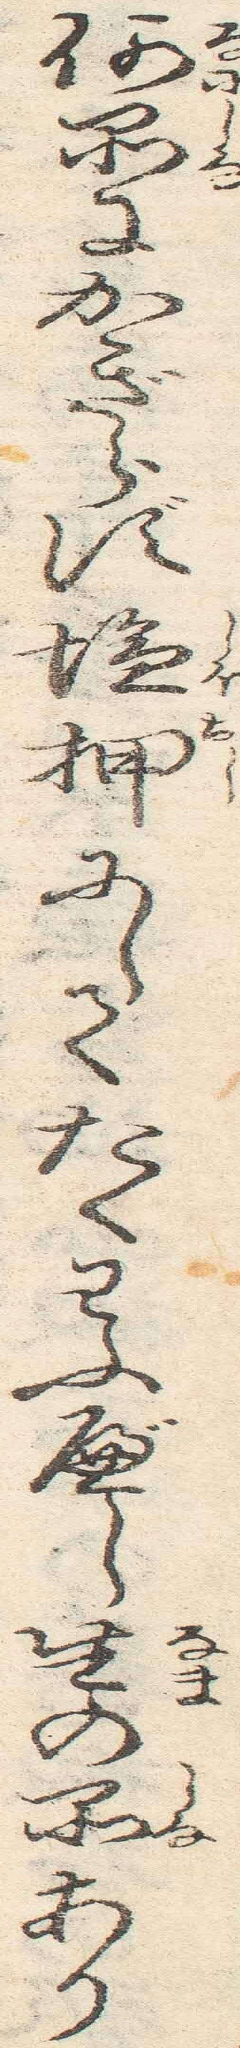何品にかぎらず塩押にしてたくわふべし生の品あり
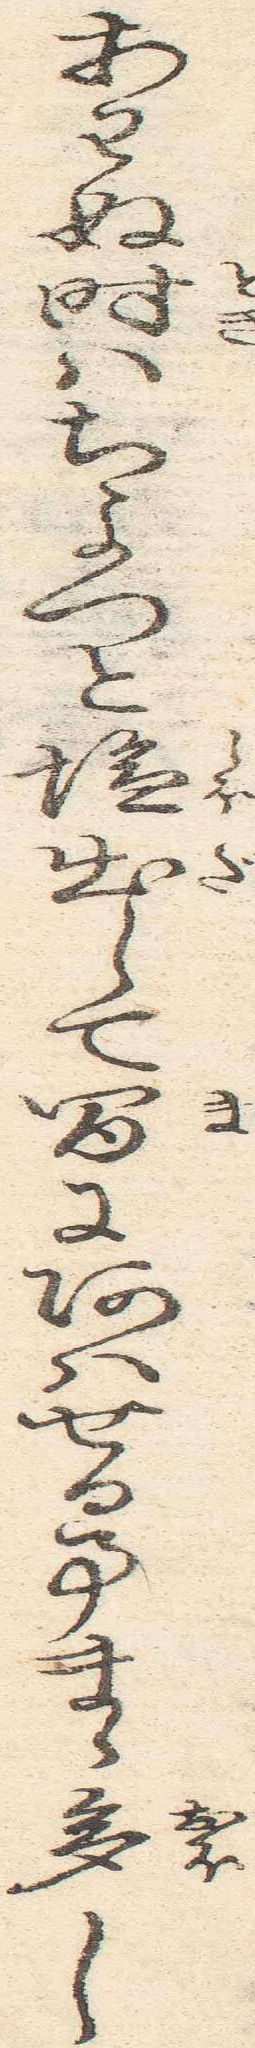あわぬ時はちよつと塩出して間にあはせる事まゝ多し
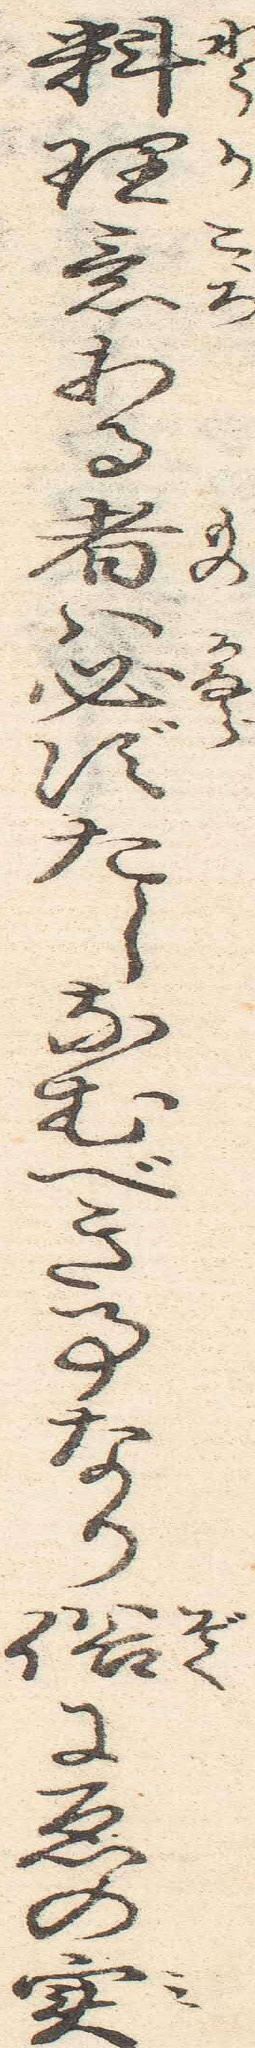料理意ある者は必ずたしなむべき事なり俗にゑの実
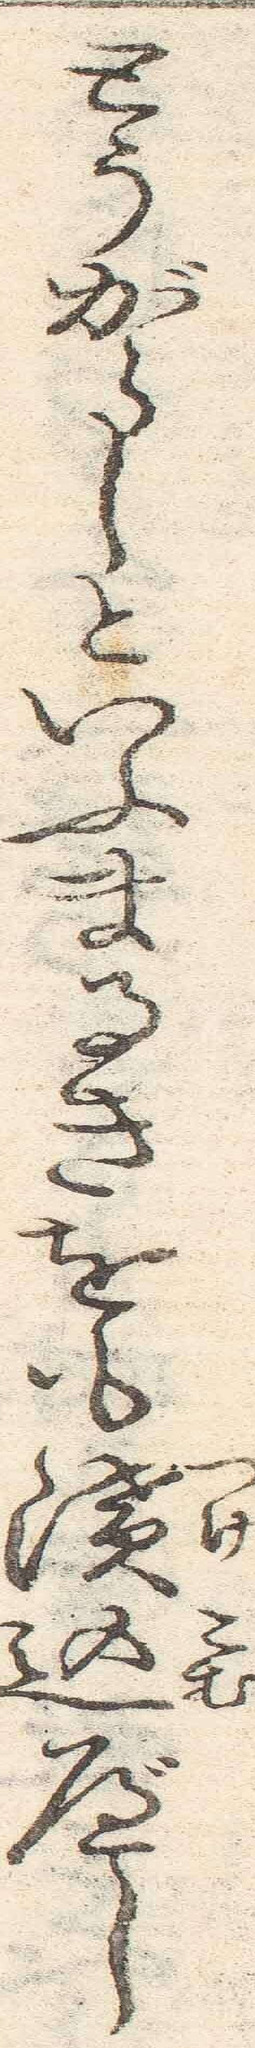とうがらしといふまるきをも漬込べし
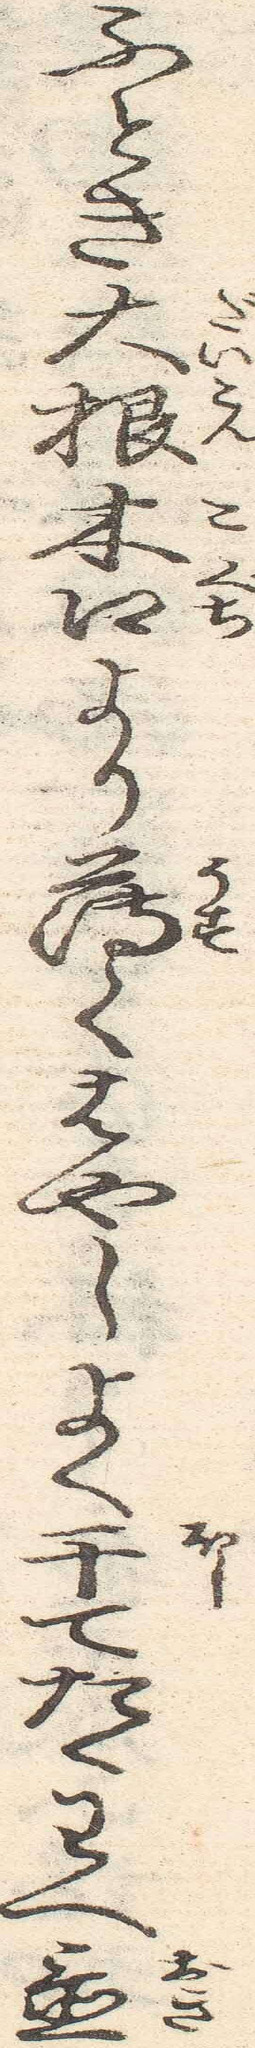ふとき大根木口より薄くはやしよく干てたくわへ置
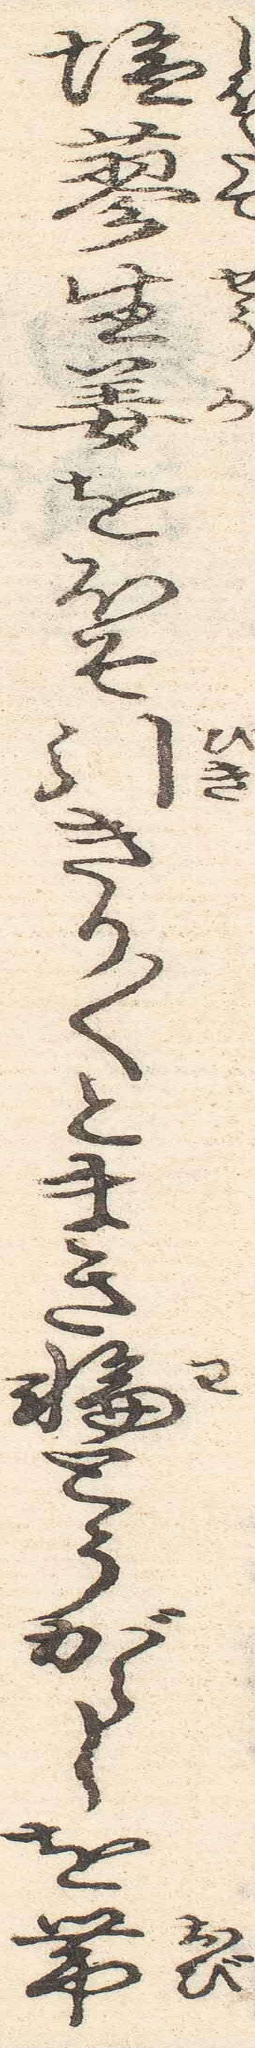塩蓼生姜をほそ引きり〳〵とまき輪とうがらしを帯
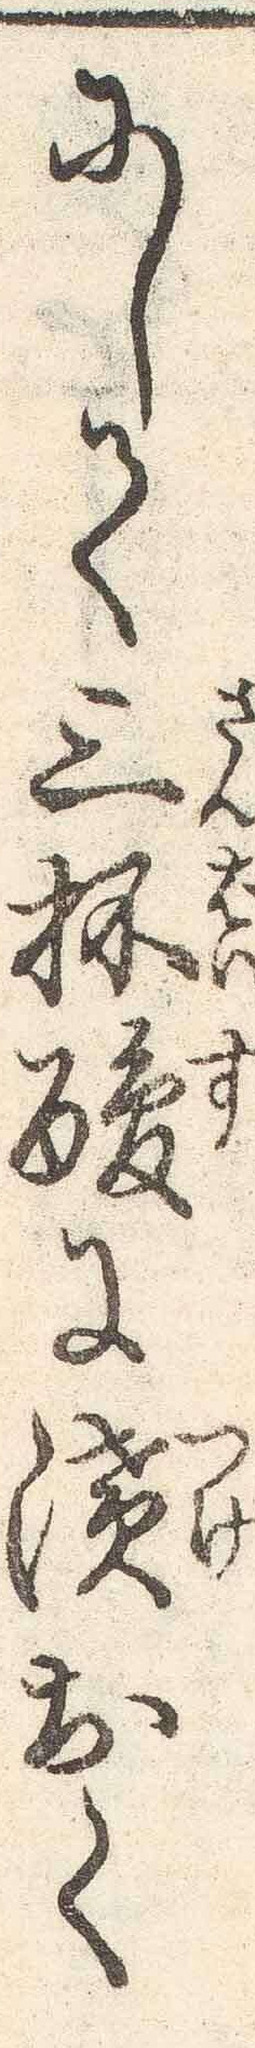にして三杯酸に漬おく
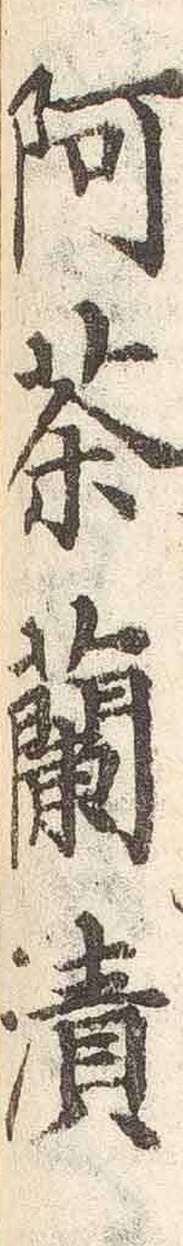阿茶蘭漬
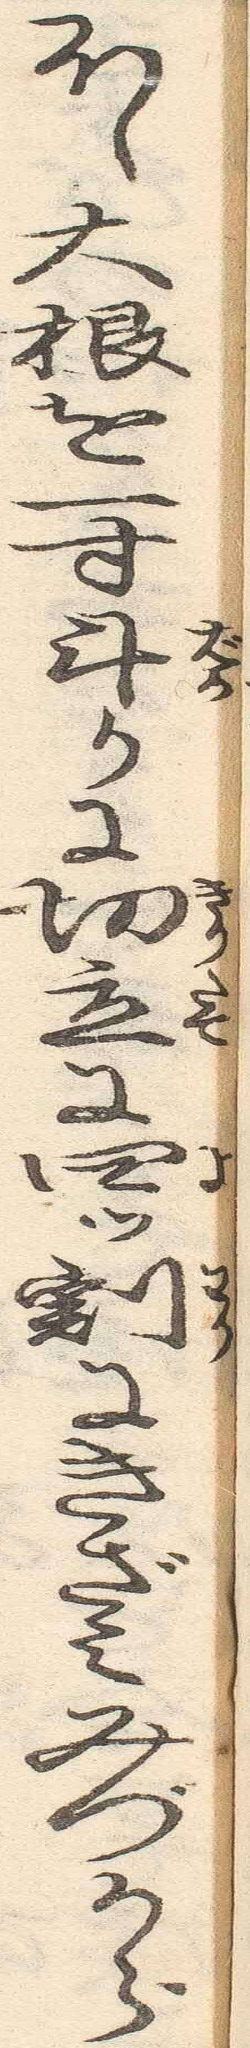ほし大根を一寸斗りに切立に四ッ割にきざみづから
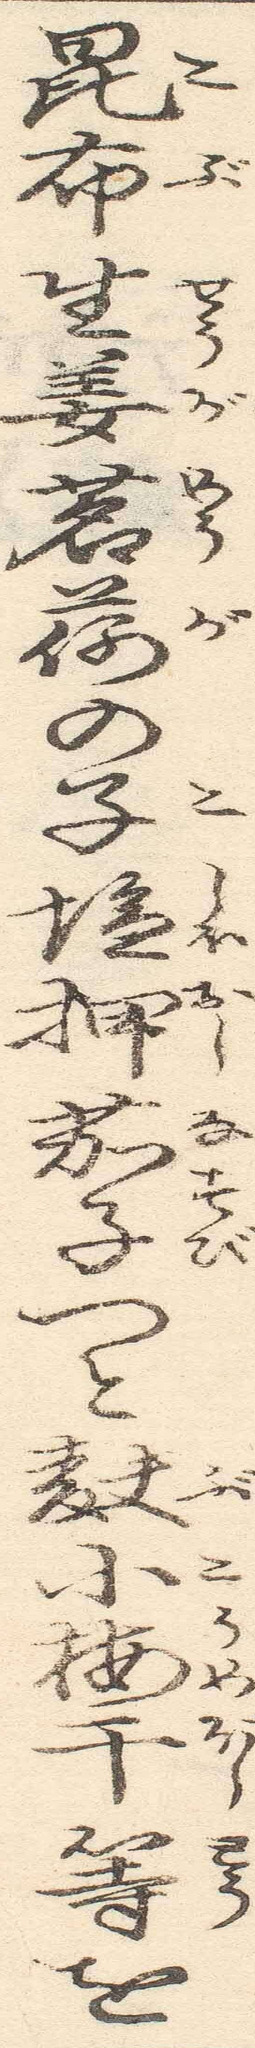昆布生姜茗荷の子塩押茄子つと麩小梅干等を
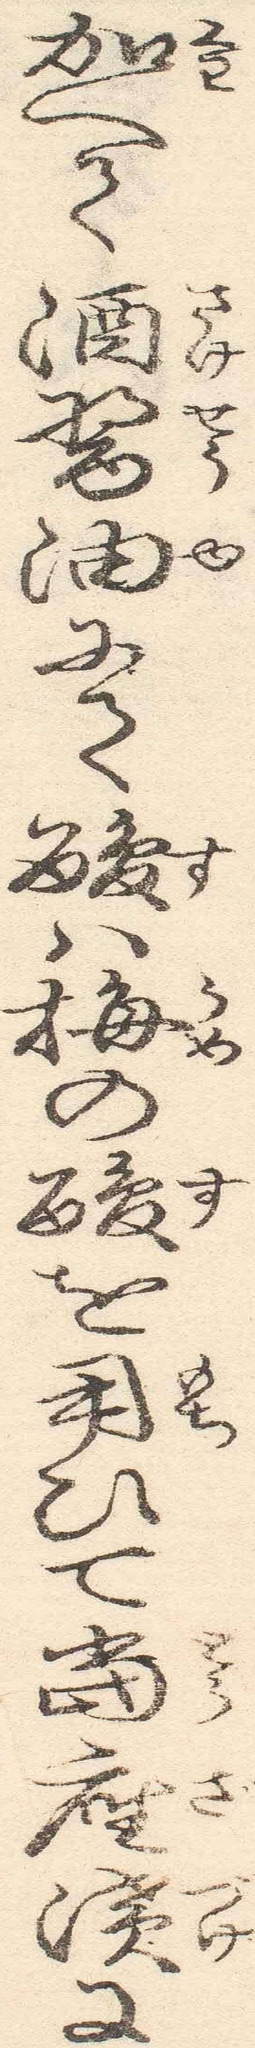加へて酒醤油にて酸は梅の酸を用ひて当座漬に
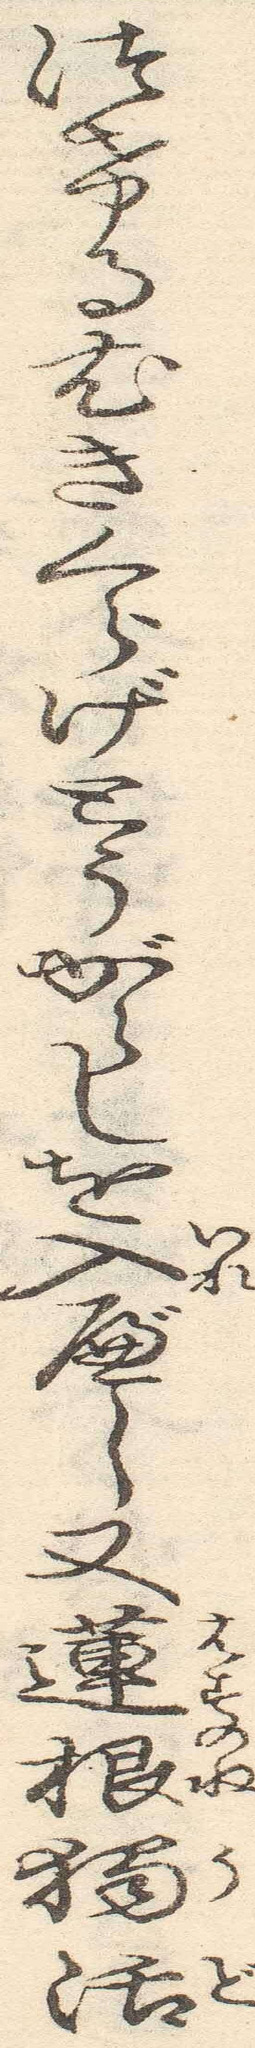つける尤きくらげとうがらしを入べし又蓮根独活
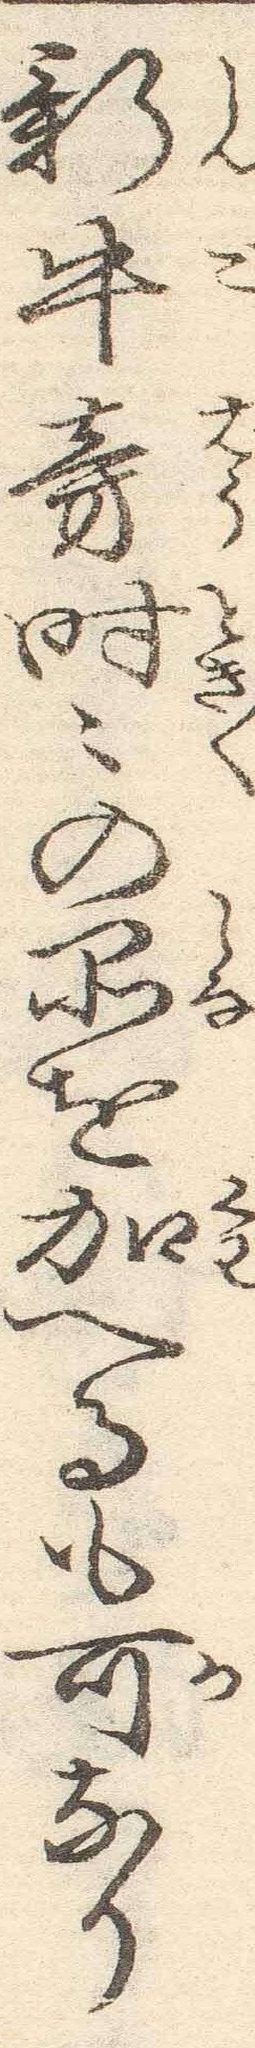新牛房時々の品を加へるも可なり
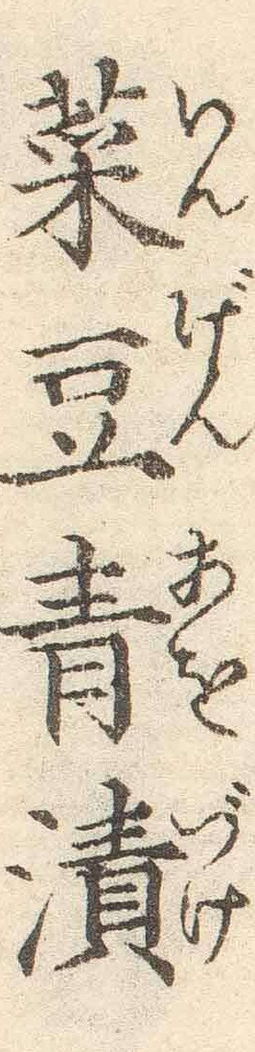菜豆青漬
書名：四季漬物塩嘉言
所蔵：東京学芸大学附属図書館 国文学研究資料館
